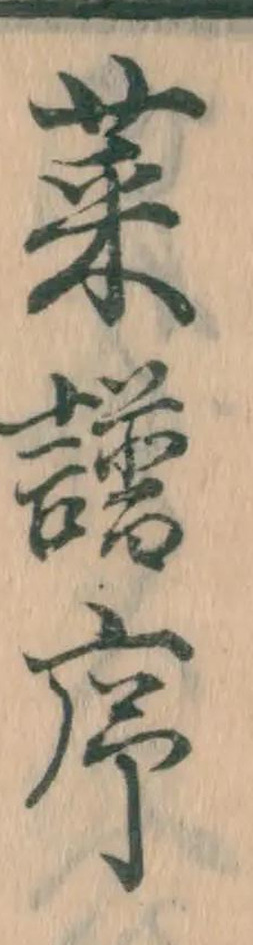菜譜序
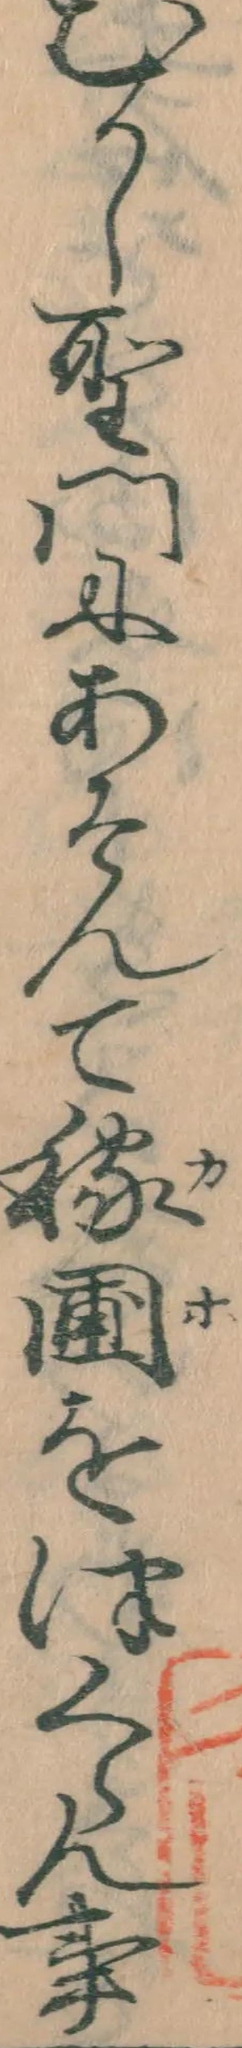むかし聖門にあそんて稼圃をつくらん事
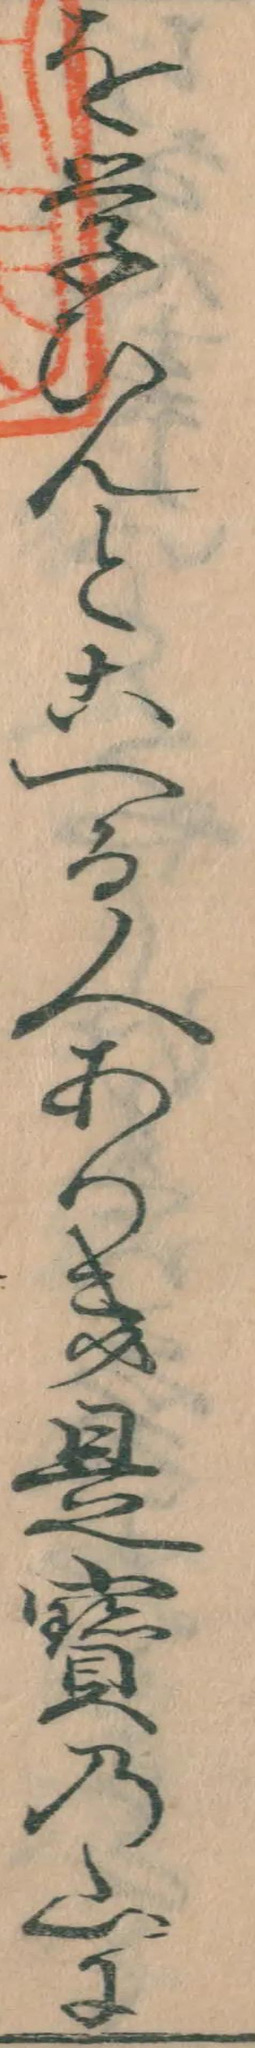を学ひんとこへる人ありき是宝の山に
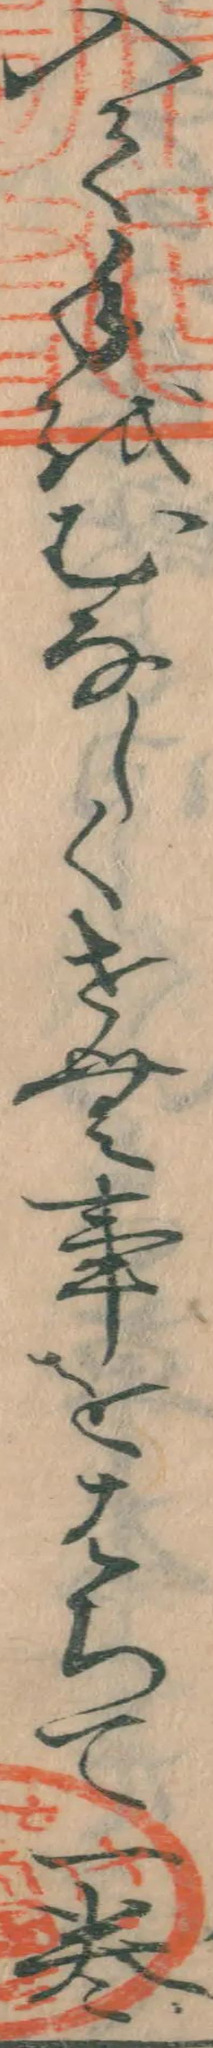入て手をむなしくせむ事をはちて一巻
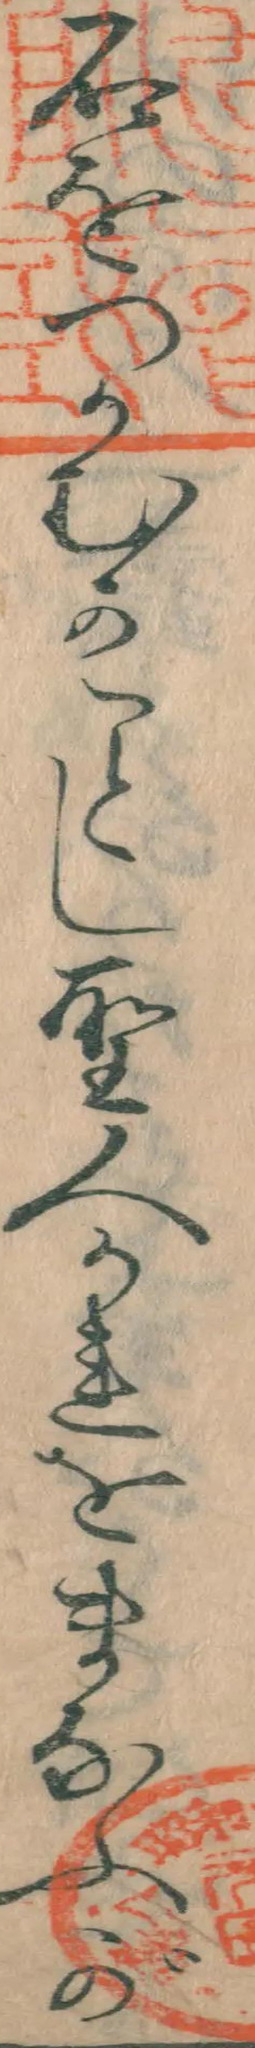石をつかむかことし聖人かれをまなふが
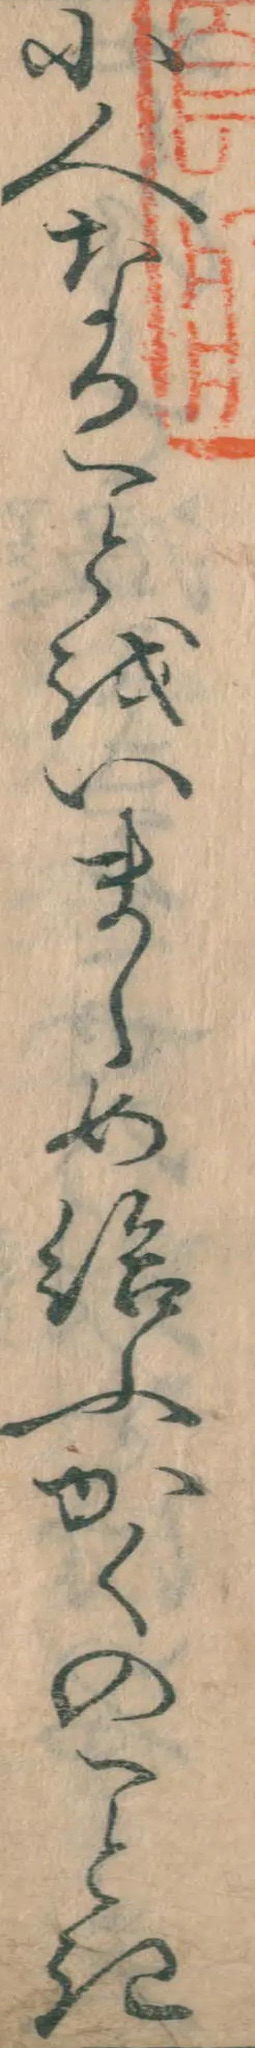小人なることをいましめ給ふかくのことき
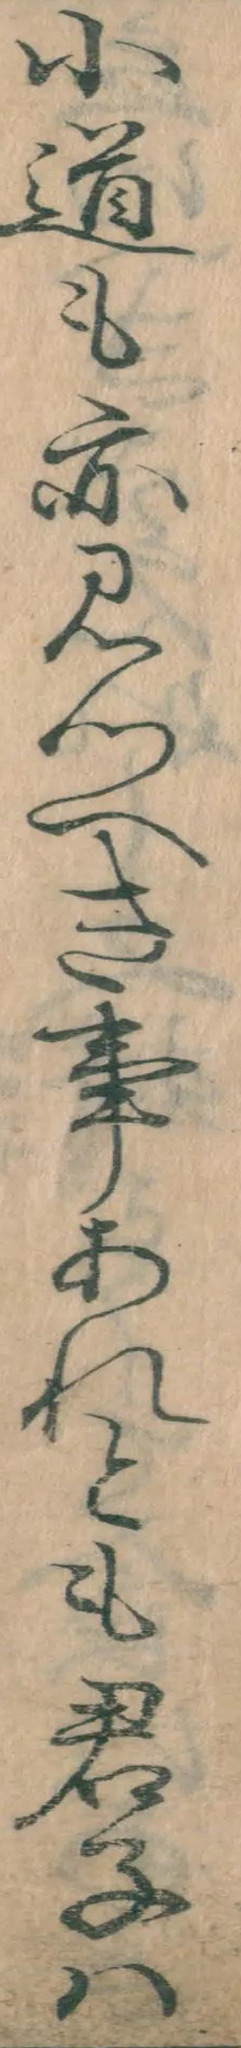小道も亦見つへき事あれとも君子は
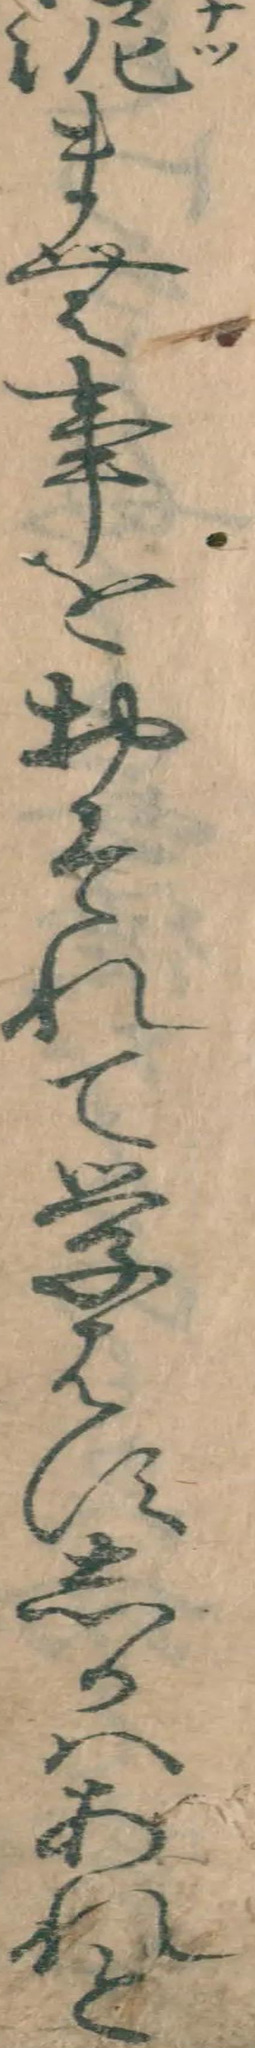泥まむ事をおそれて学はすしかはあれと

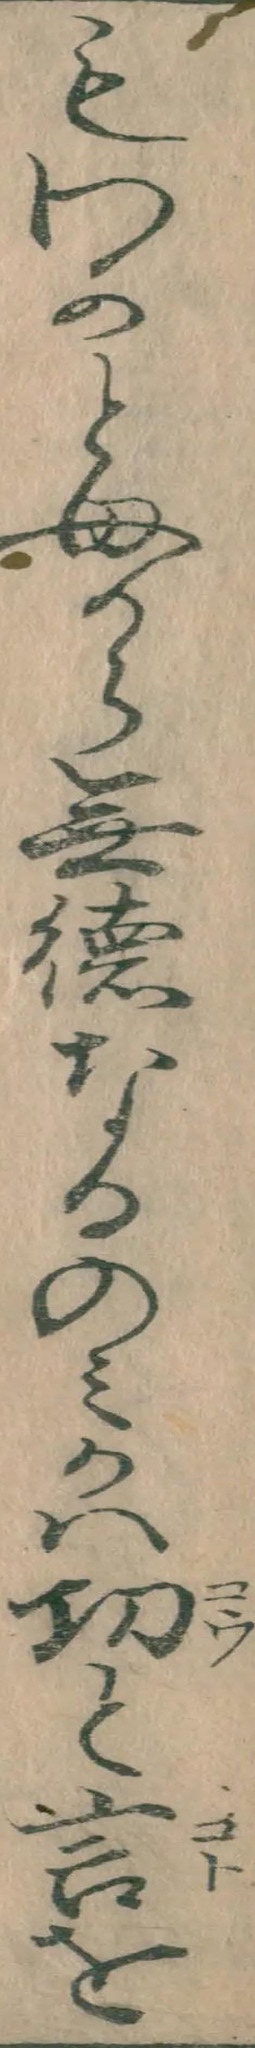もわかともから無徳なるのみかは功と言を
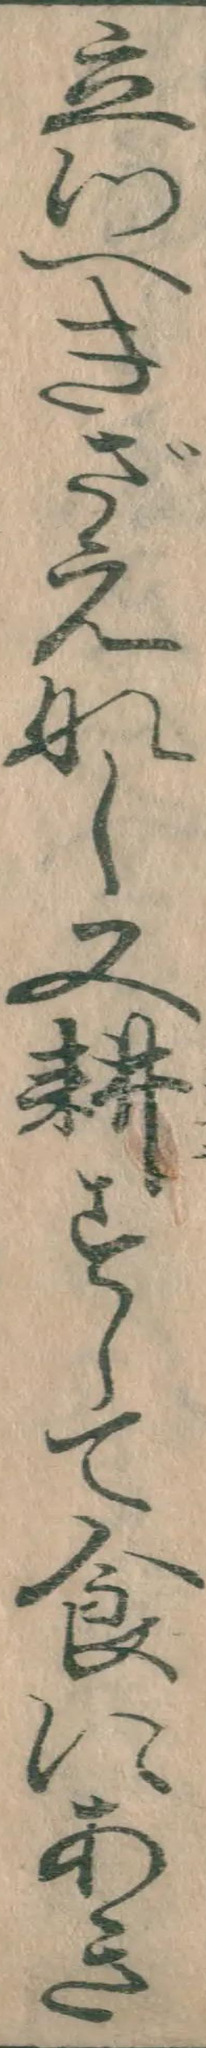立つへきざえなし又耕すして食にあき
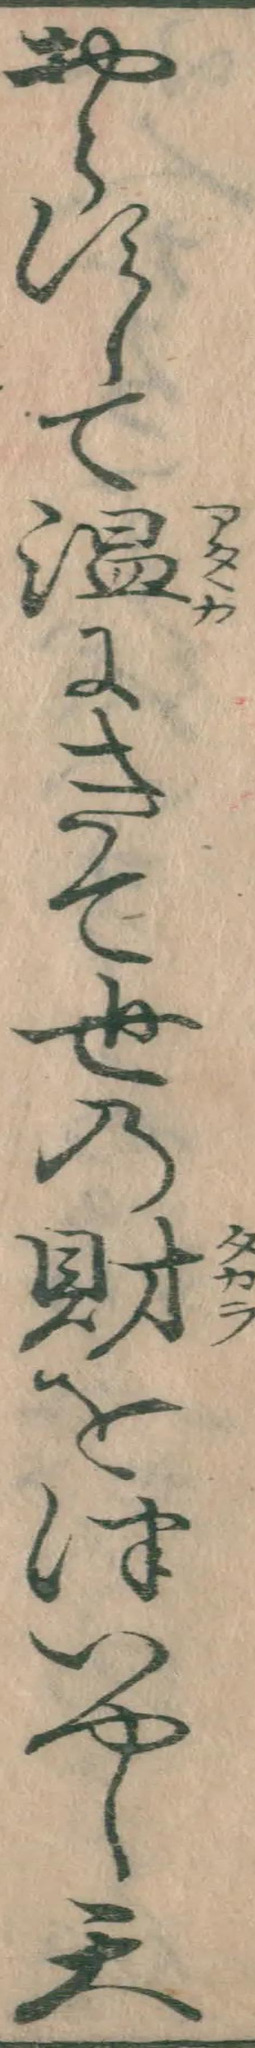おらすして温にきて世の財をついやし天
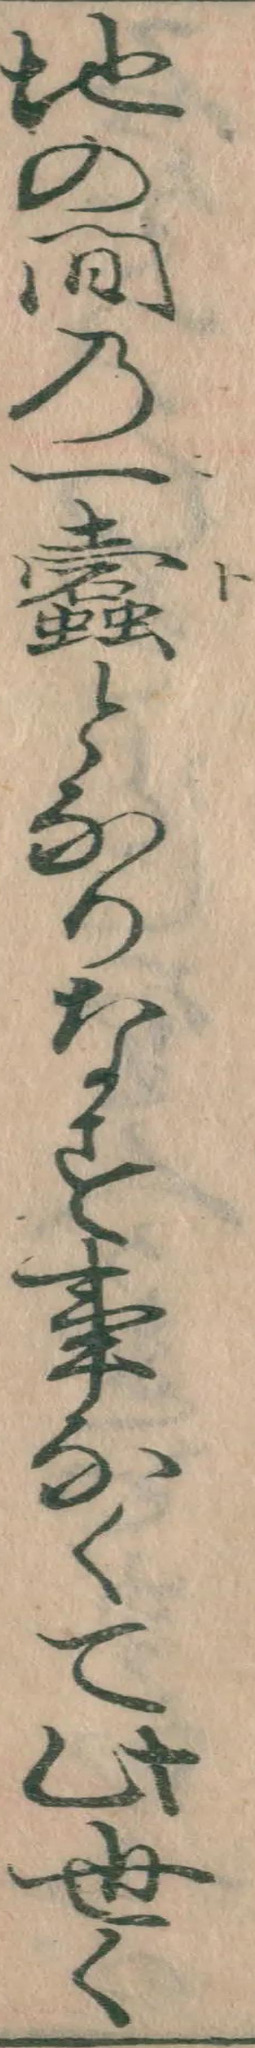地の間の一蠧となりなす事なくて此世く
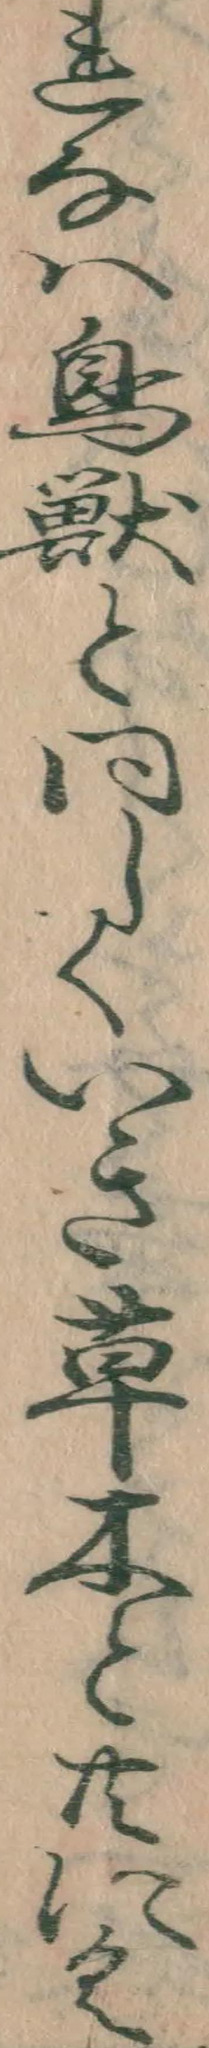れなは鳥獣と同しくいき草木と共にく
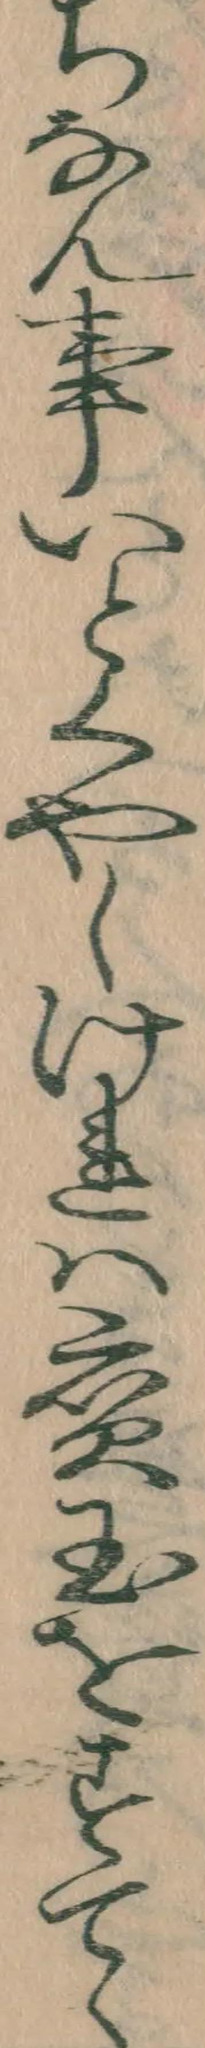ちなん事いとくやしけれは宝玉をすてゝ
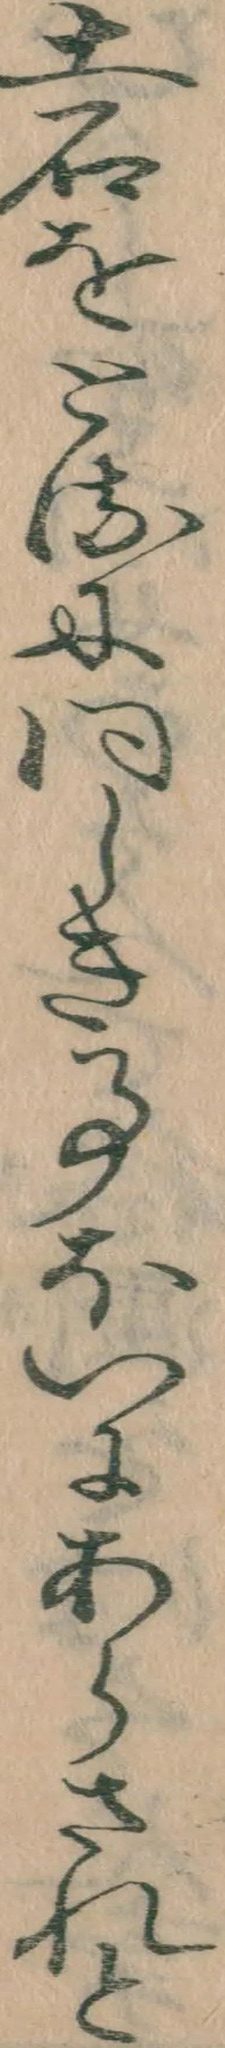土石をとるに同しき事ほいにあらされと
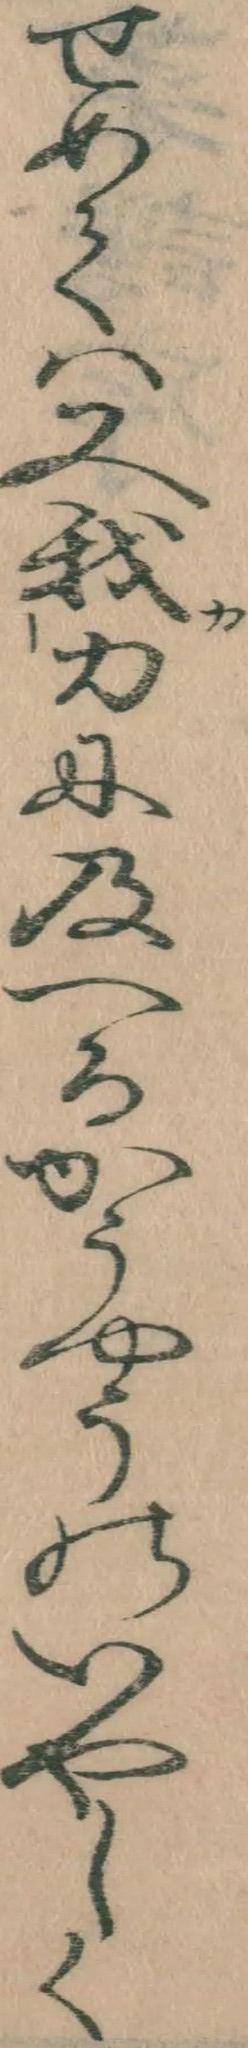せめては又我ｰ力に及へるかうやうのいやしく
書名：菜譜 3巻
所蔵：国立国会図書館 National Diet Library, JAPAN
